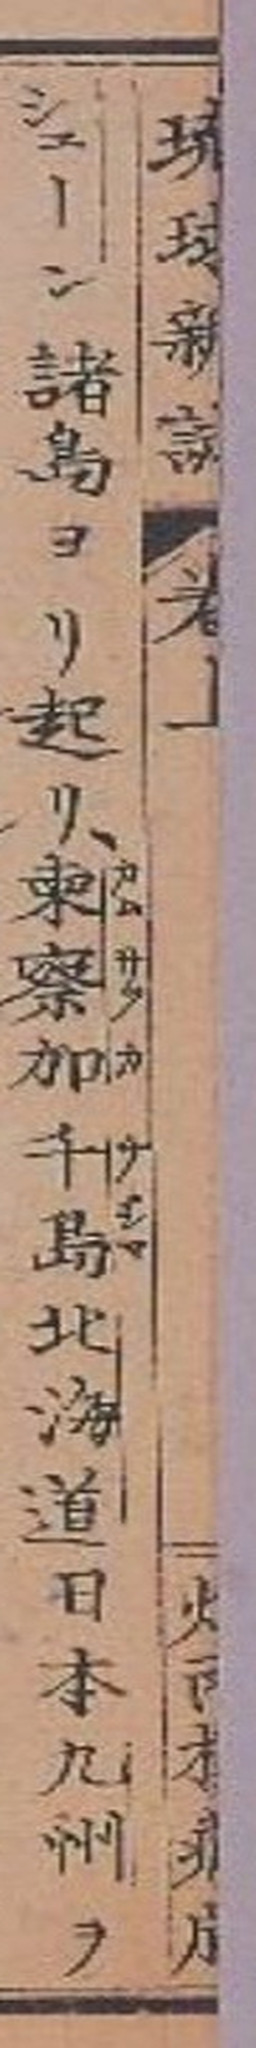シェーン諸島ヨリ起リ、柬察加千島北海道日本九州ヲ
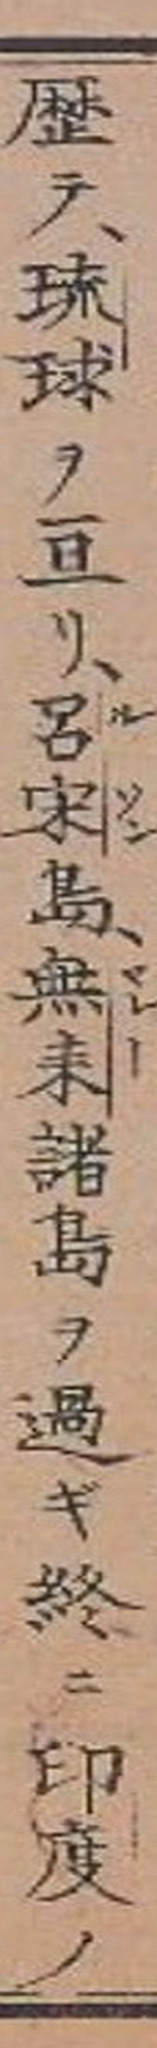歴テ、琉球ヲ亘リ、呂宋島、無来諸島ヲ過ギ終ニ印度ノ
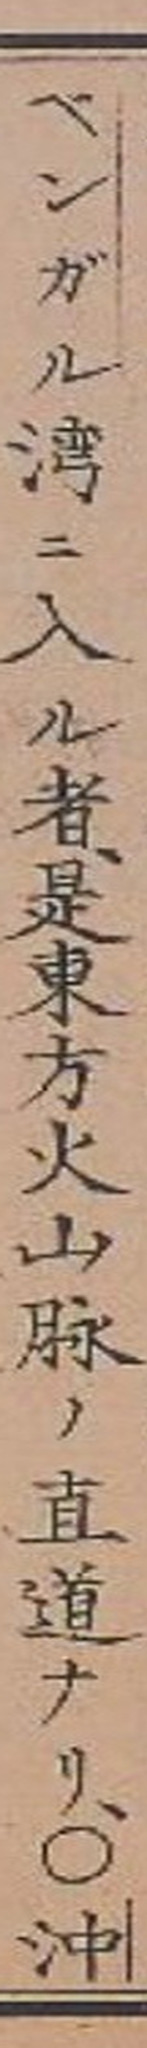ベンガル湾ニ入ル者、是東方火山脈ノ直道ナリ、○沖
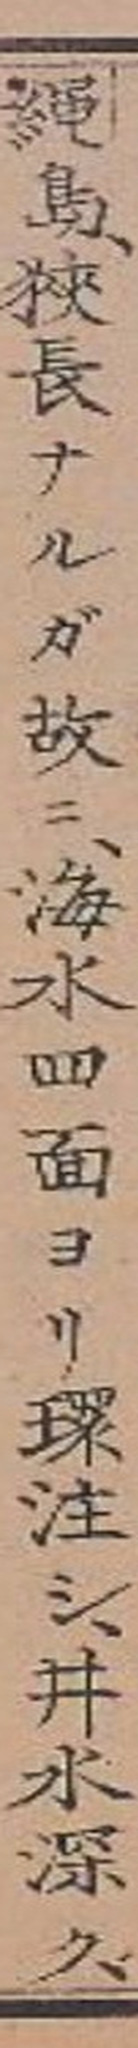縄島、狭長ナルガ故ニ、海水四面ヨリ環注シ、井水深ク、
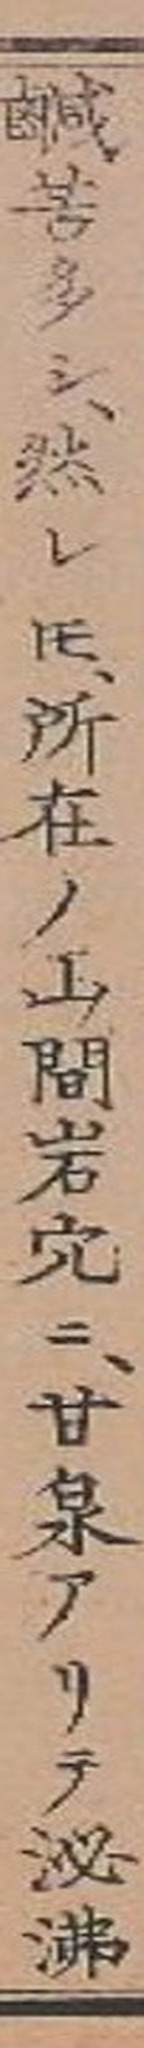鹹苦多シ、然レトモ、所在ノ山間岩穴ニ、甘泉アリテ必沸
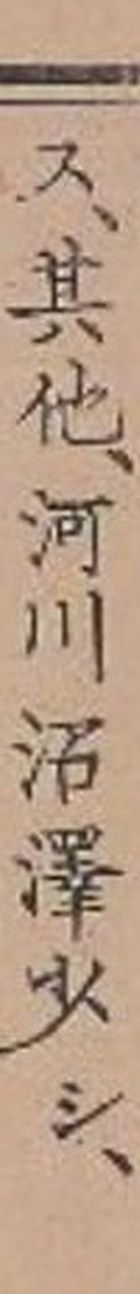ス、其他、河川沼沢少シ、
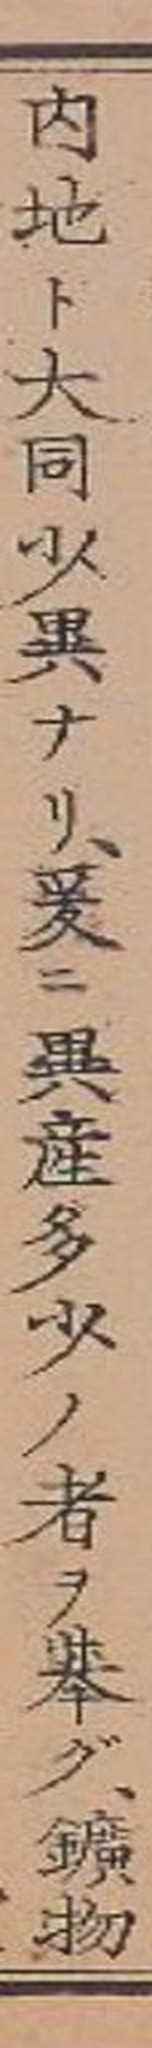内地ト大同少異ナリ、爰ニ異産多少ノ者ヲ挙グ、鉱物
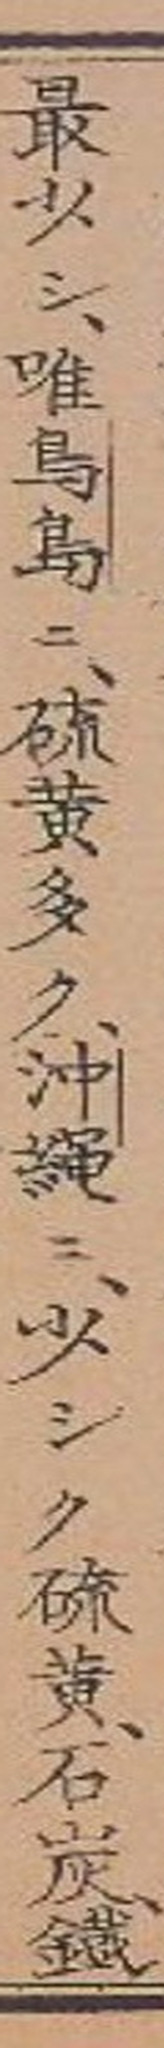最少シ、唯鳥島ニ、硫黄多ク、沖縄ニ、少シク硫黄、石炭、鉄
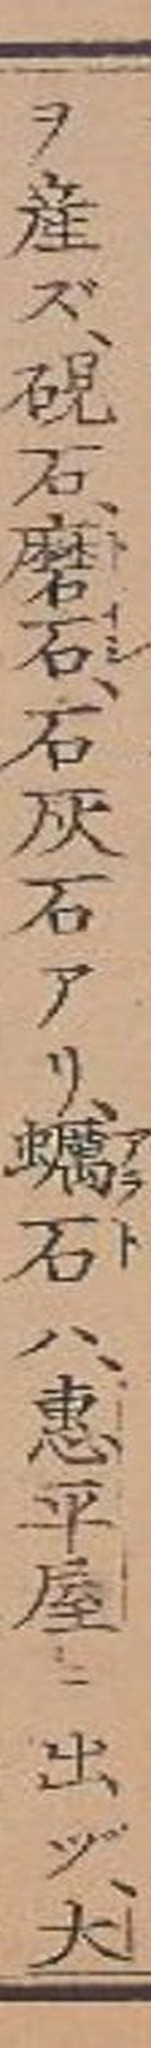ヲ産ズ、硯石、磨石、石灰石アリ、蠣石ハ、恵平屋ニ出ヅ、大
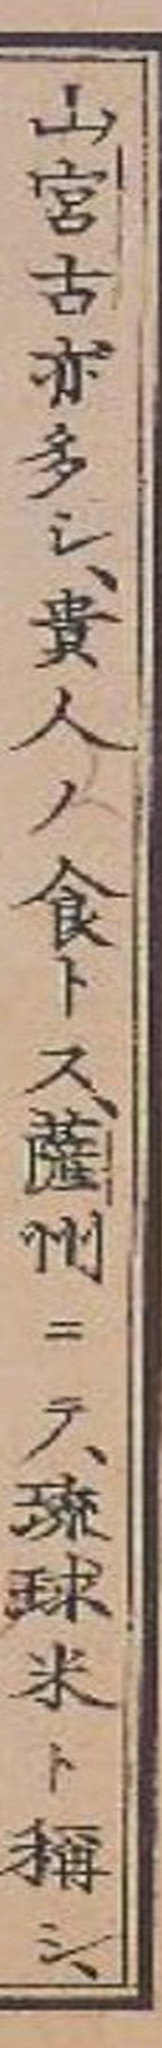山宮古亦多シ、貴人ノ食トス、薩州ニテ、琉球米ト称シ、
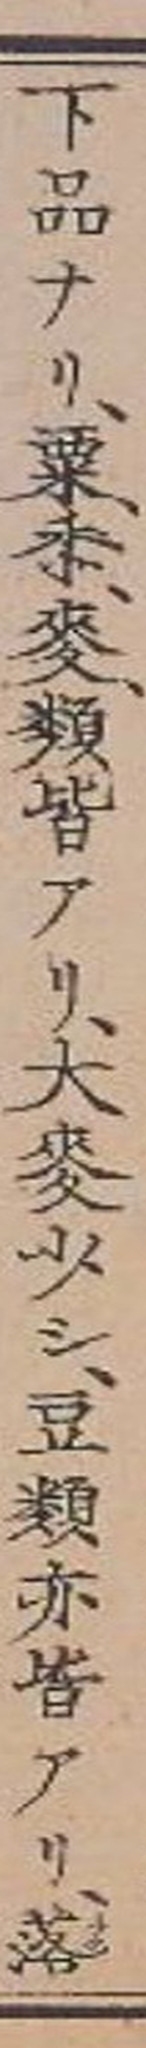下品ナリ、粟、黍、麦、類皆アリ、大麦少シ、豆類亦皆アリ、落
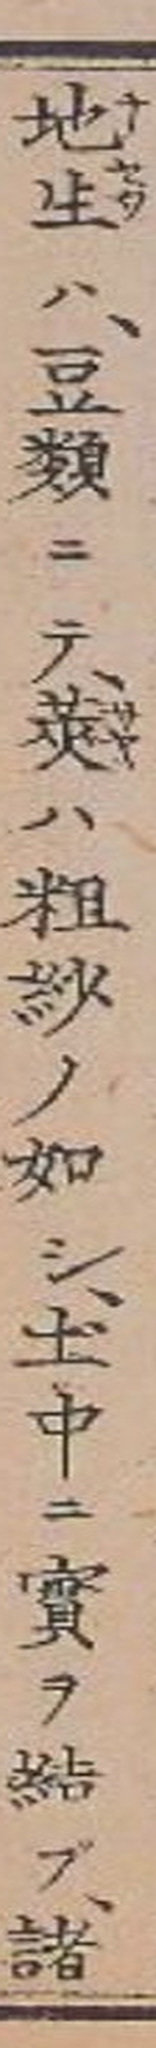地生ハ、豆類ニテ、莢ハ粗紗ノ如シ、土中ニ実ヲ結ブ、諸
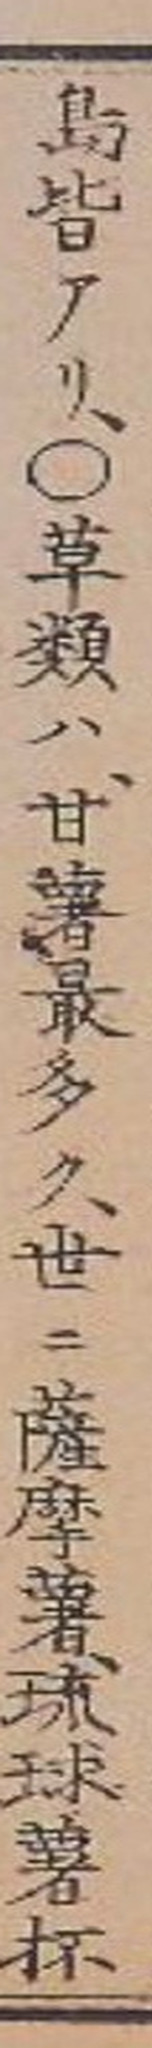島皆アリ、○草類ハ、甘薯最多ク、世ニ薩摩薯、琉球薯抔
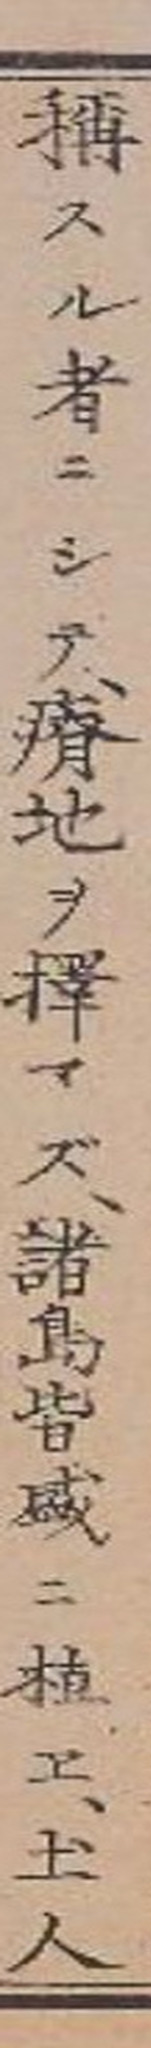称スル者ニシテ、瘠地ヲ択マズ、諸島皆盛ニ植ヱ、土人
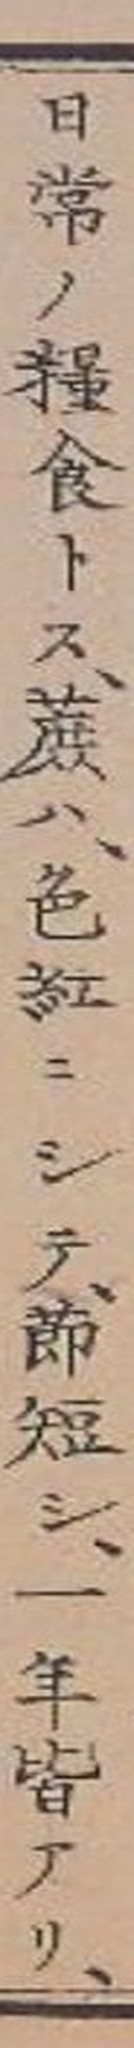日常ノ糧食トス、蔗ハ、色紅ニシテ、節短シ、一年皆アリ、
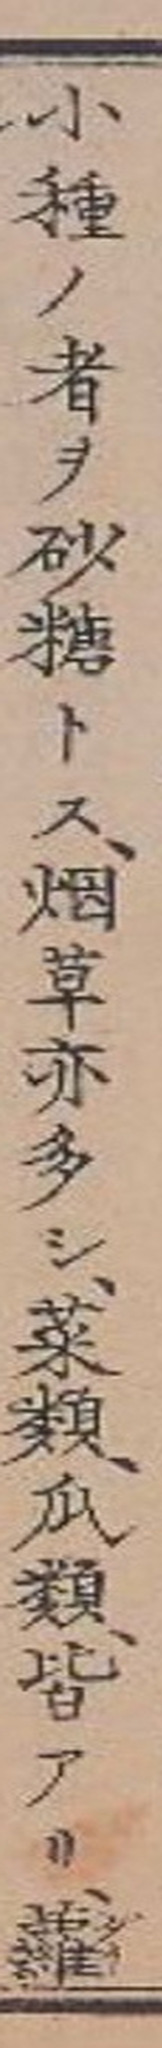小種ノ者ヲ砂糖トス、煙草亦多シ、菜類、瓜類、皆アリ、蘿
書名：琉球新誌 巻上
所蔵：University of the Ryukyus Library
